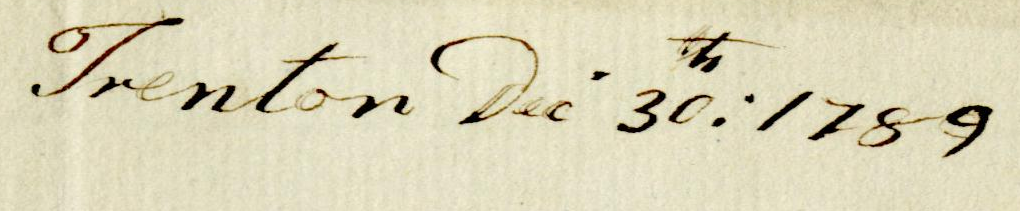Trenton Dec 30^th. 1789
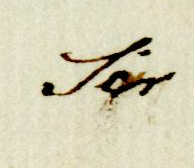Sir
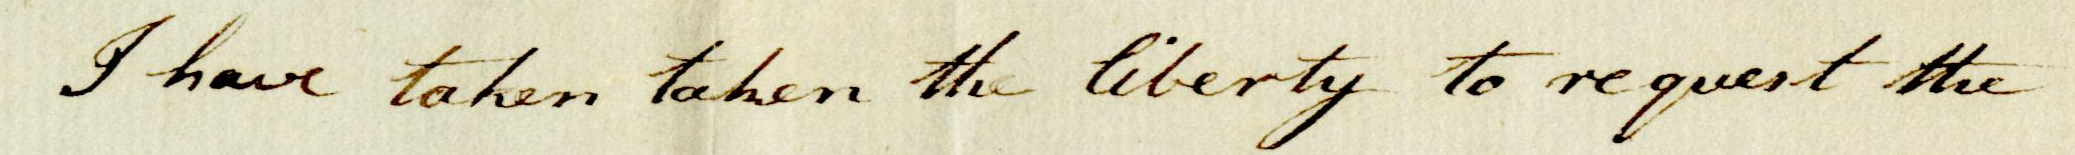I have taken taken the liberty to request the
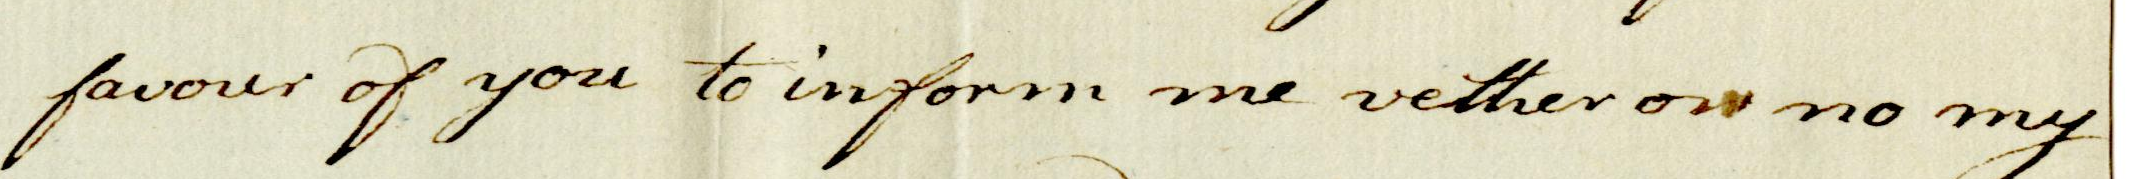favour of you to inform me wether or no my
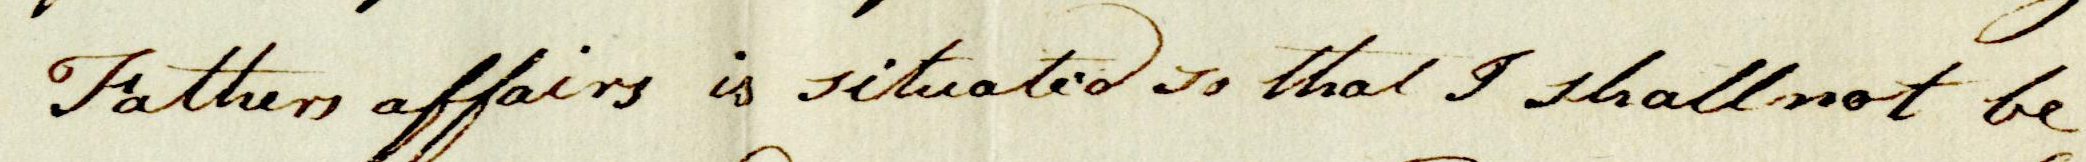Fathers affairs is situated so that I shall not be
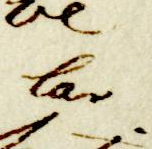lar
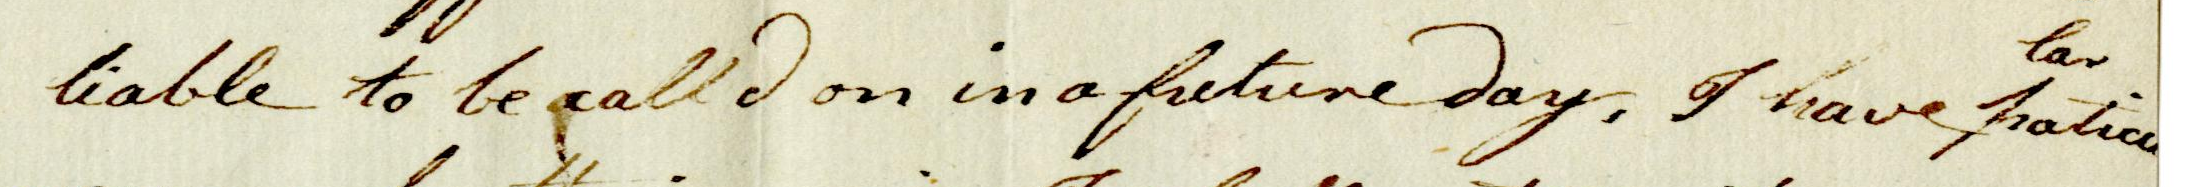liable to be call'd on in a future day, I have particu
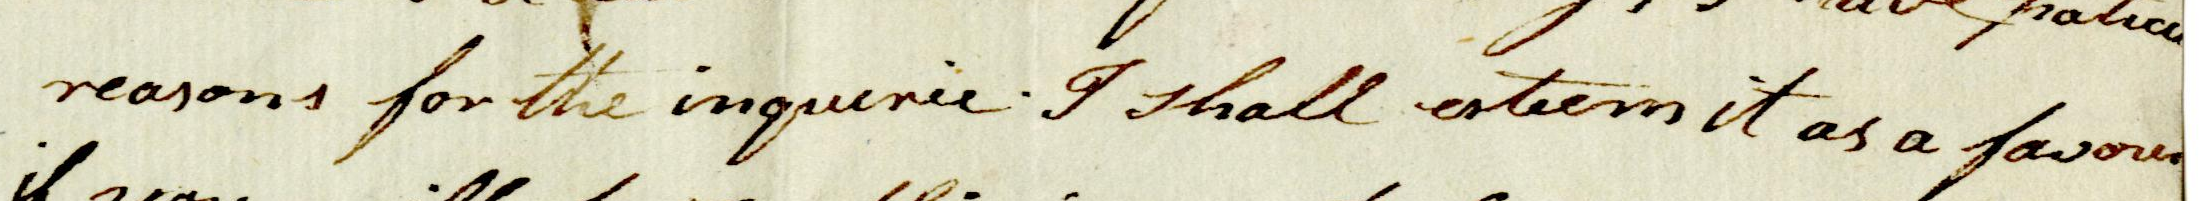reasons for the inquirie. I shall esteem it as a favour
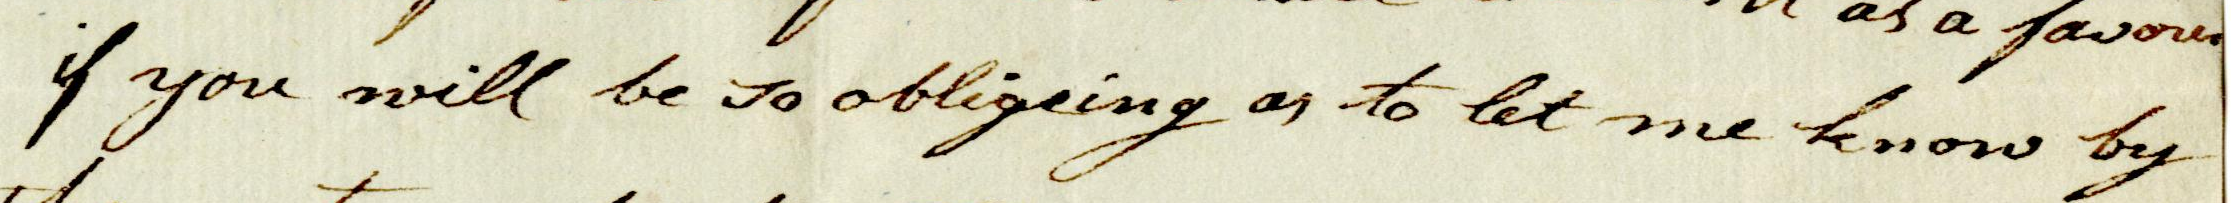if you will be so obliging as to let me know by
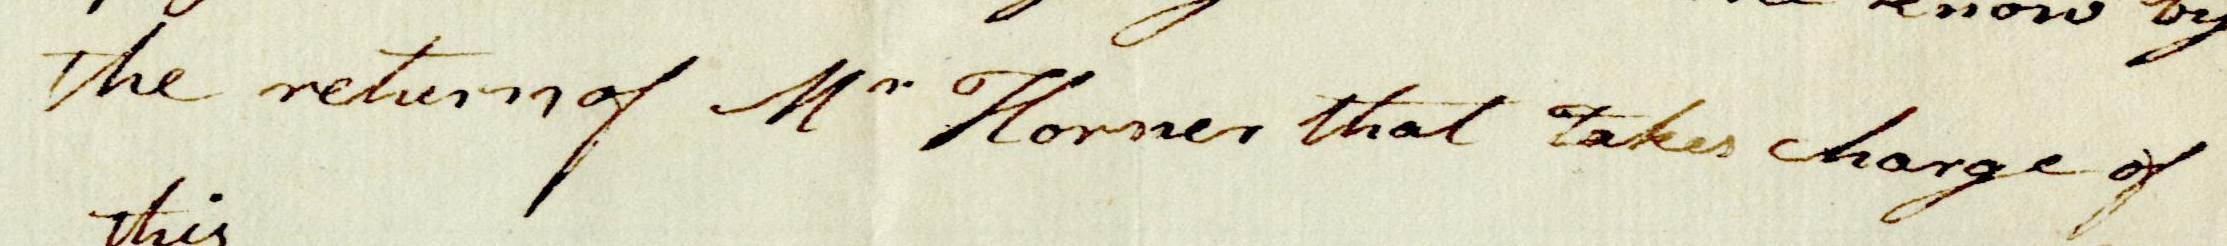the return of M^r. Horner that takes charge of
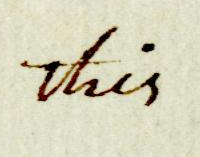this
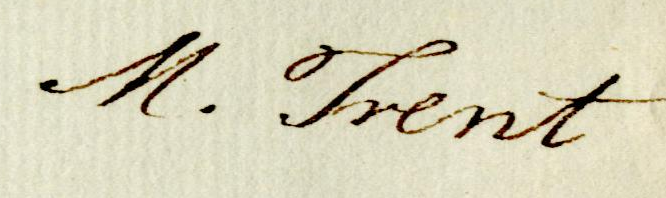M. Trent
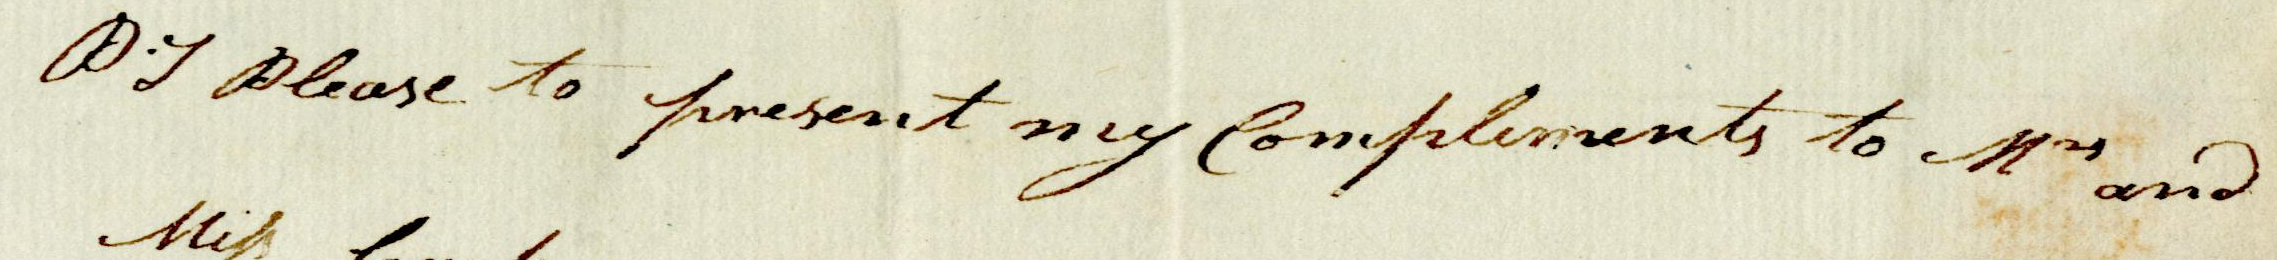P.S Please to present my Complements to M^rs and
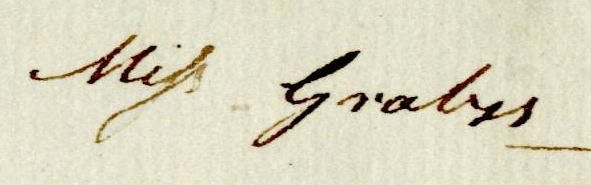Miss Gratzs
